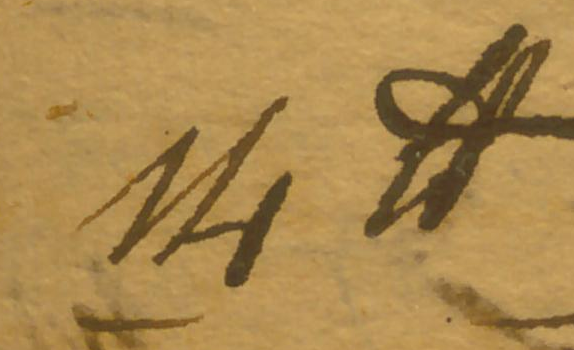14 lb
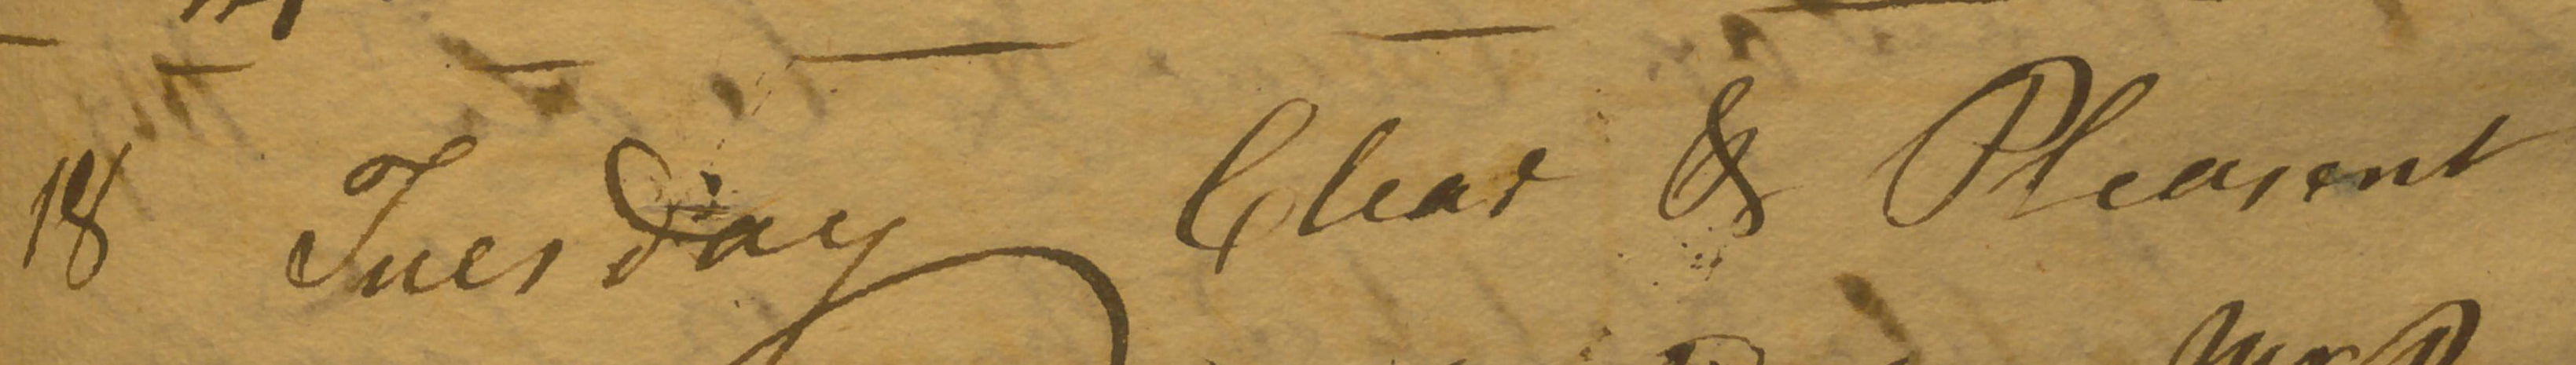18 Tuesday, Clear & Pleasent
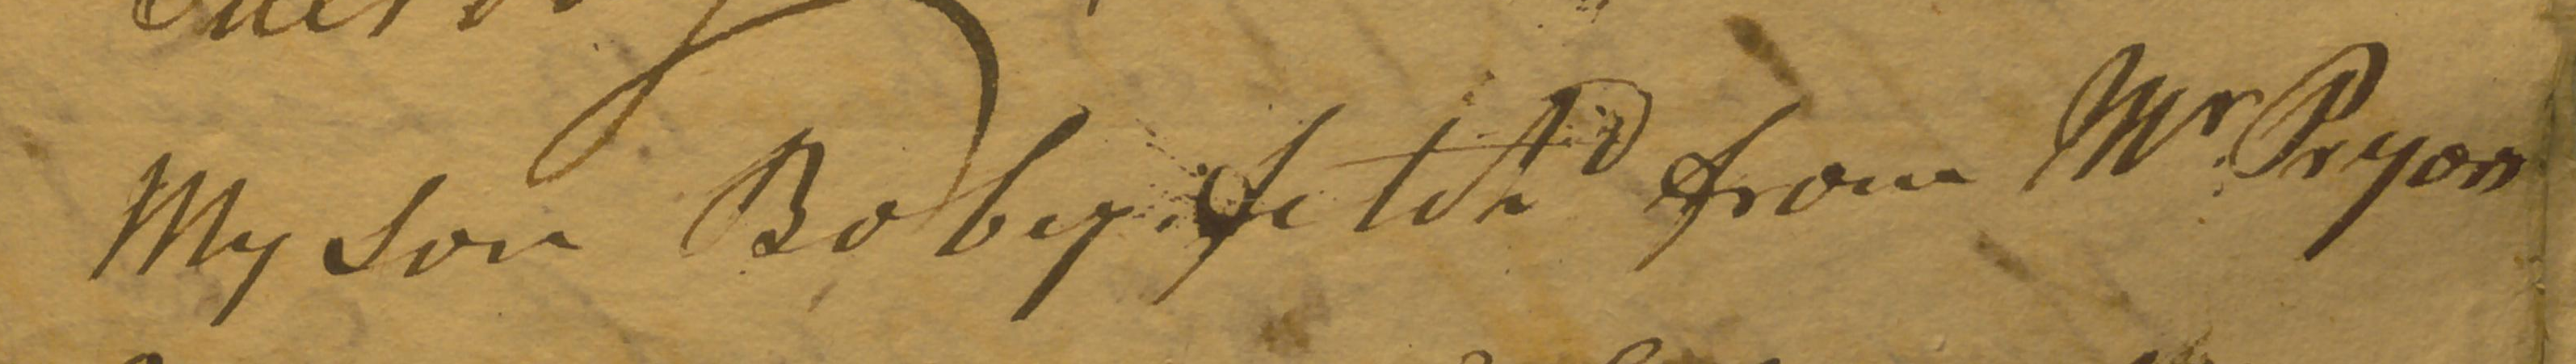My son Bobey fetch^d from M^r. Pryor
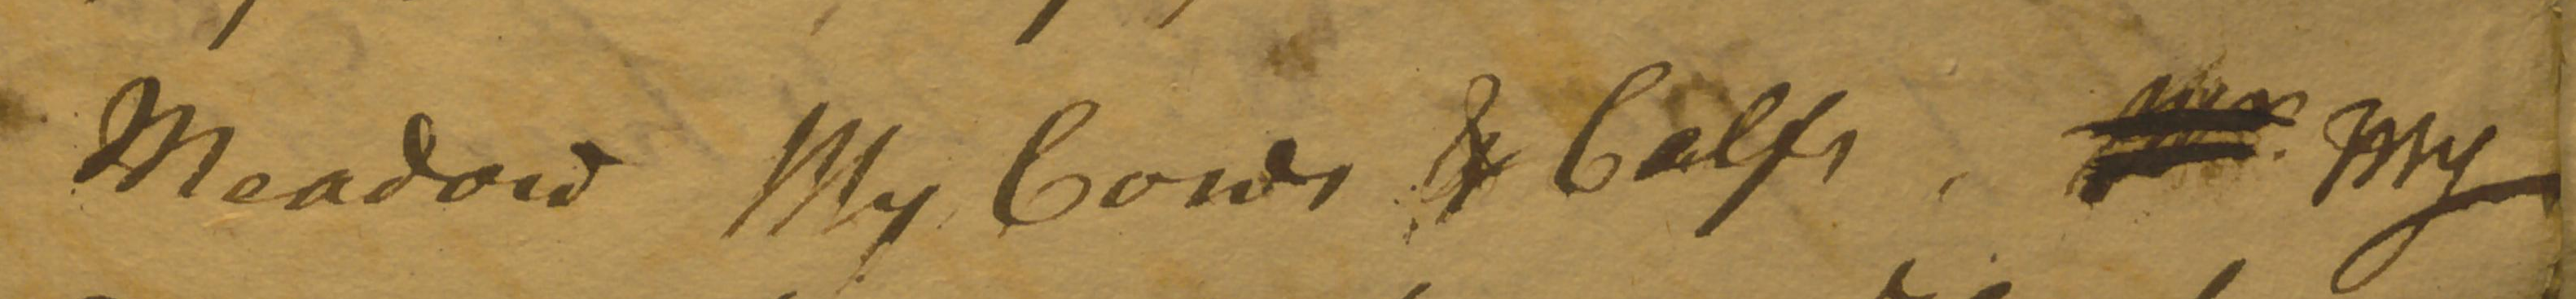Meadow My Cows & Calfs. [M^r.] My
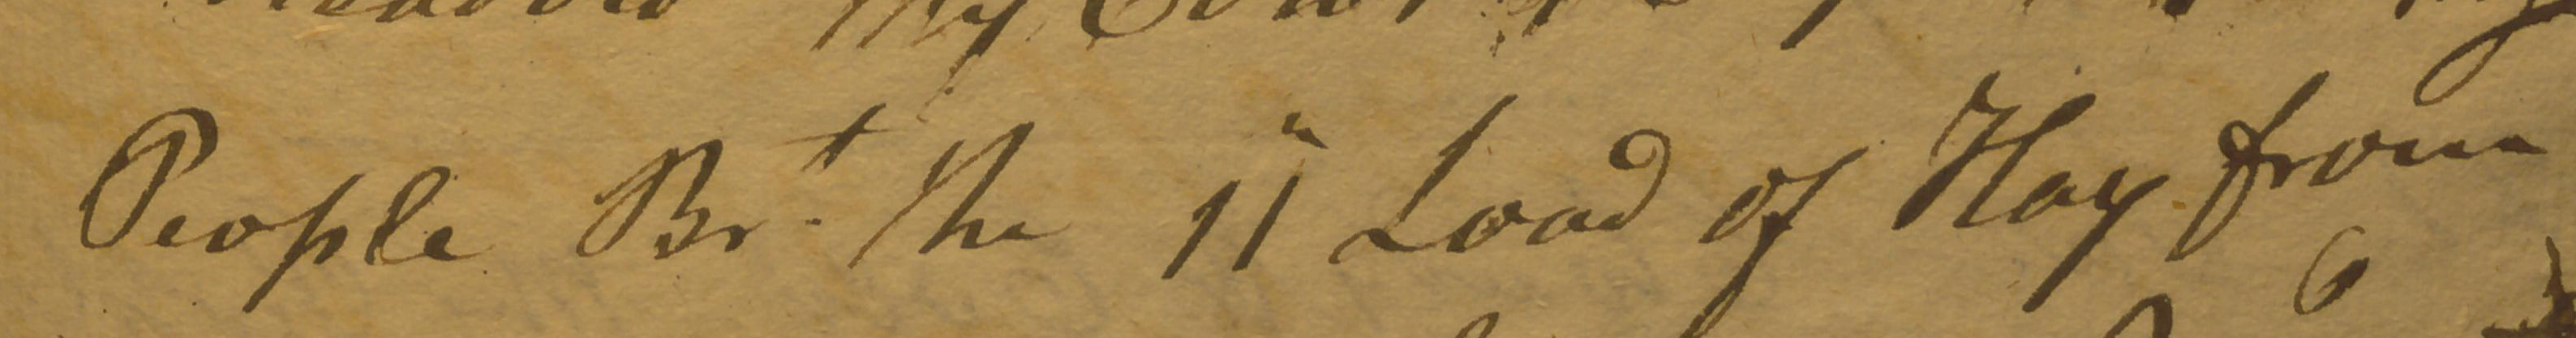People Br^t. the 11^th Load of Hay from
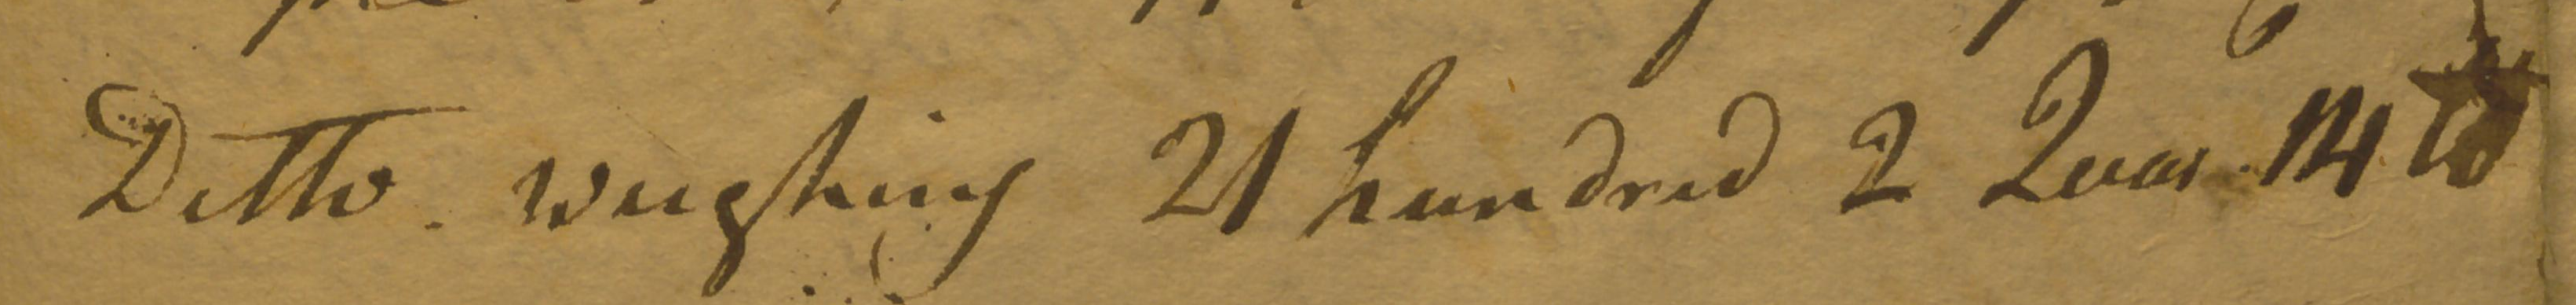Ditto. weighing 21 hundred 2^ Quar 14 lb
